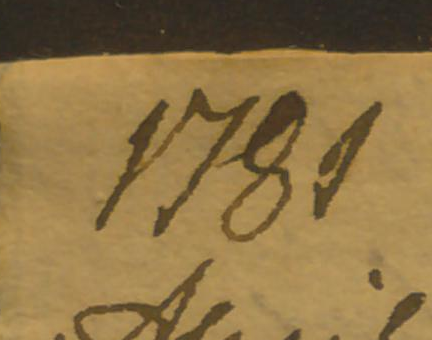1781
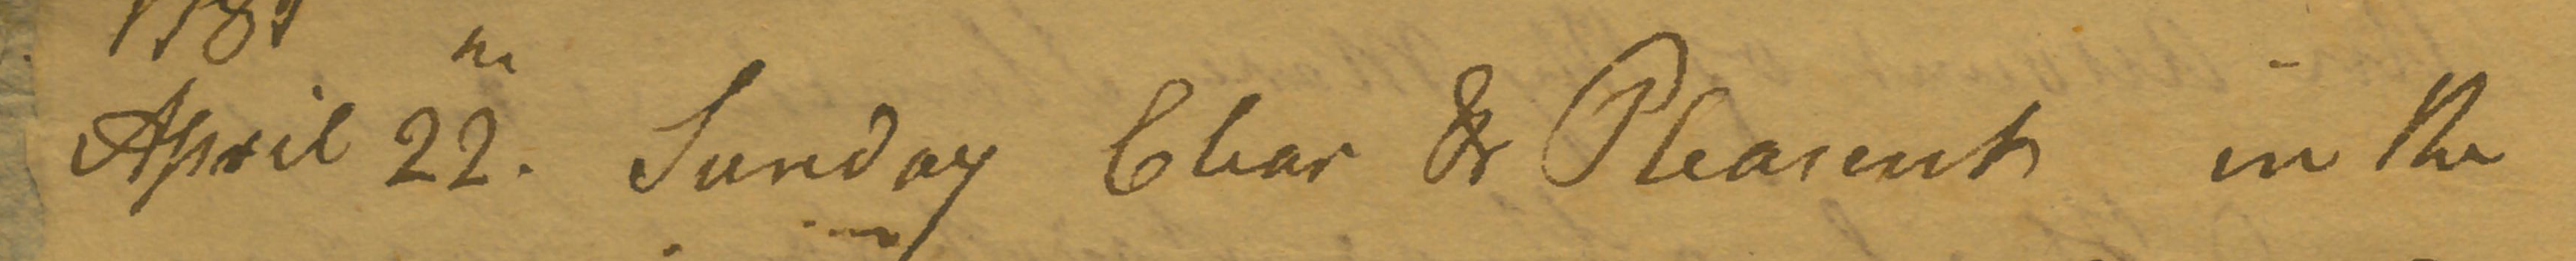April 22^th. Sunday Clear & Pleasent in the
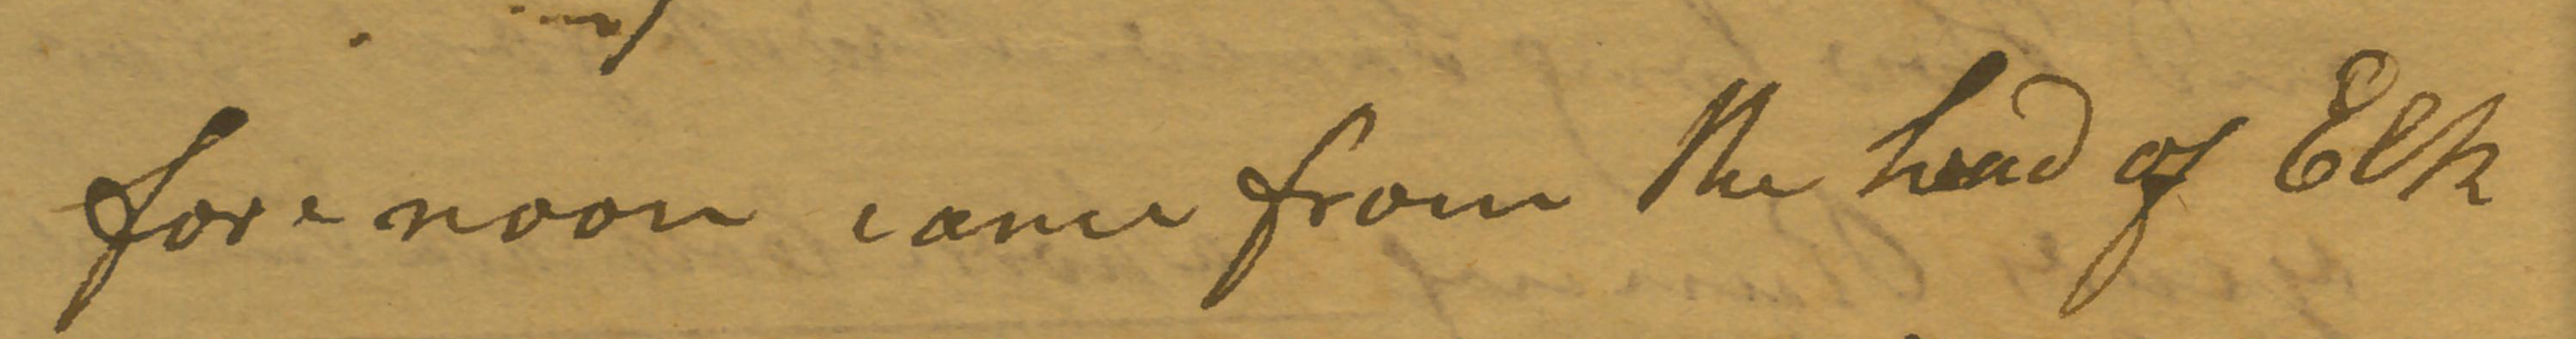forenoon came from the head of Elk
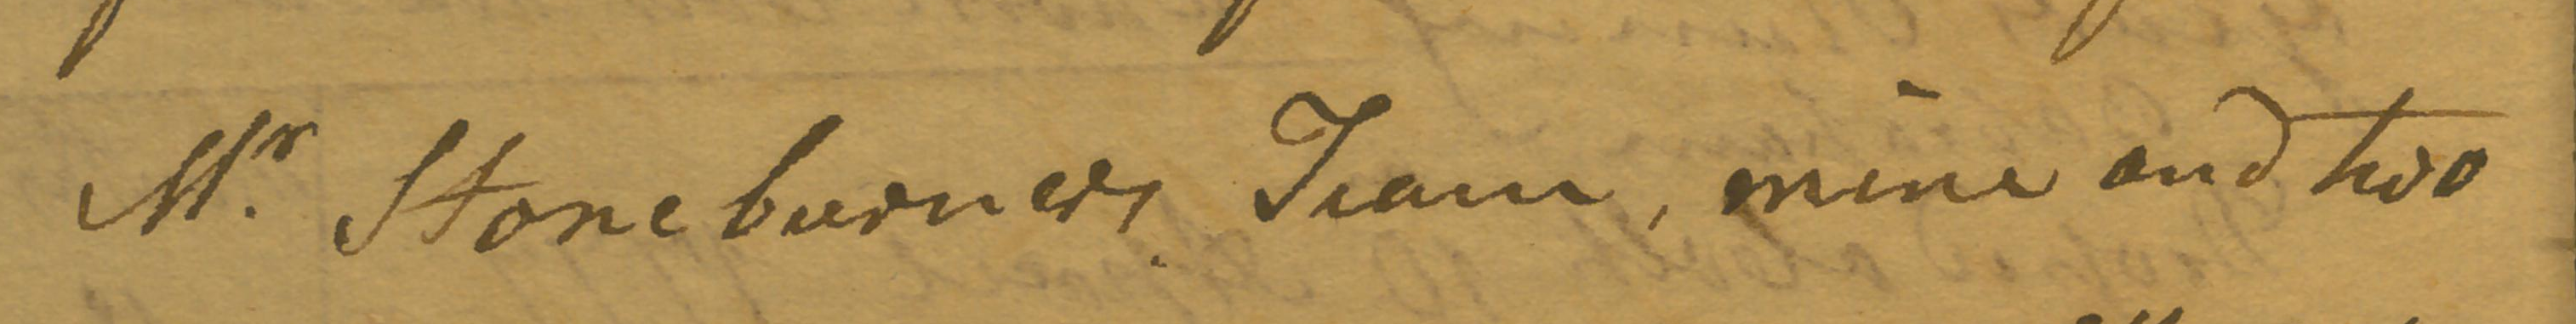M^r. Stoneburners Team, mine and two
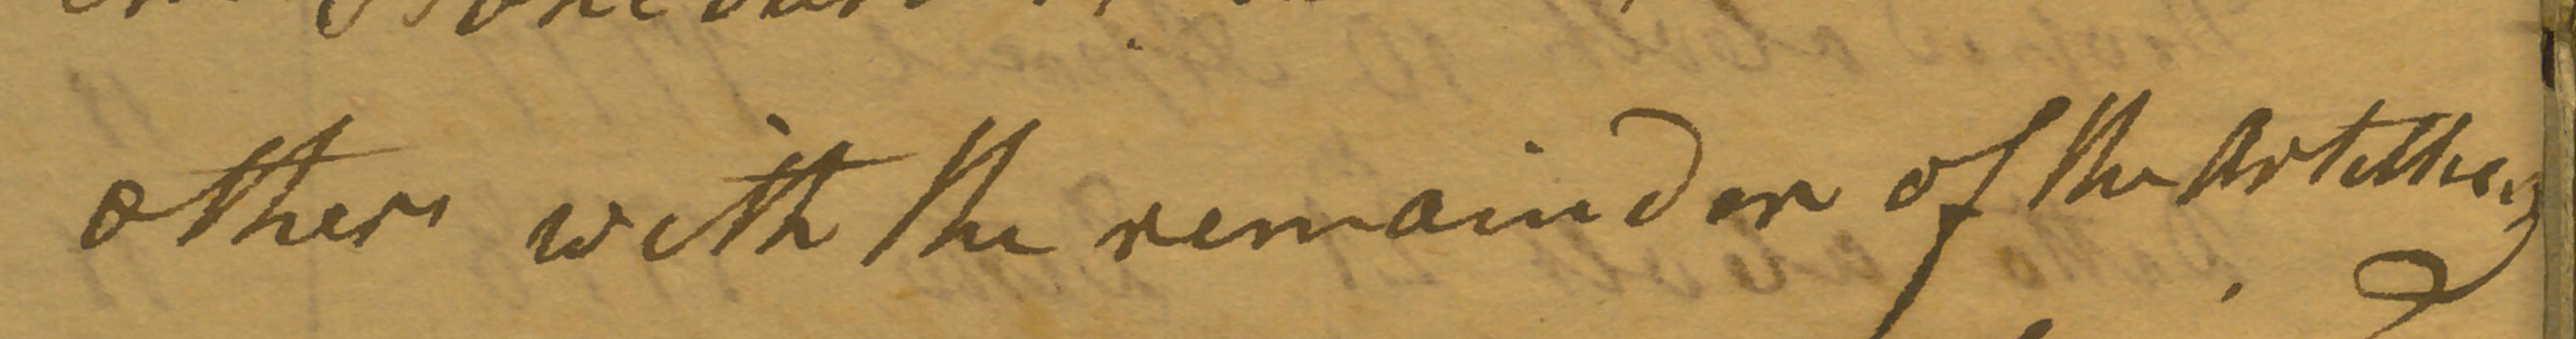others with the remainder of the Articles
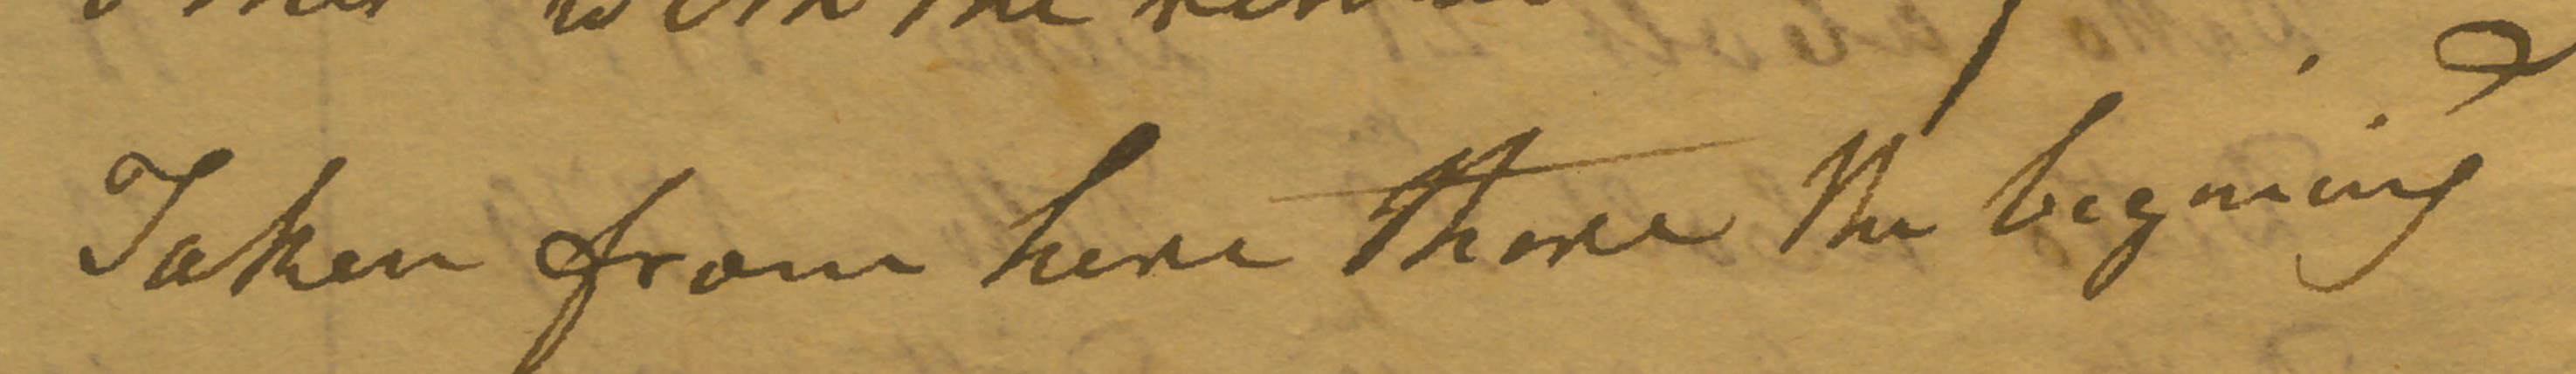Taken from here there the beginning
